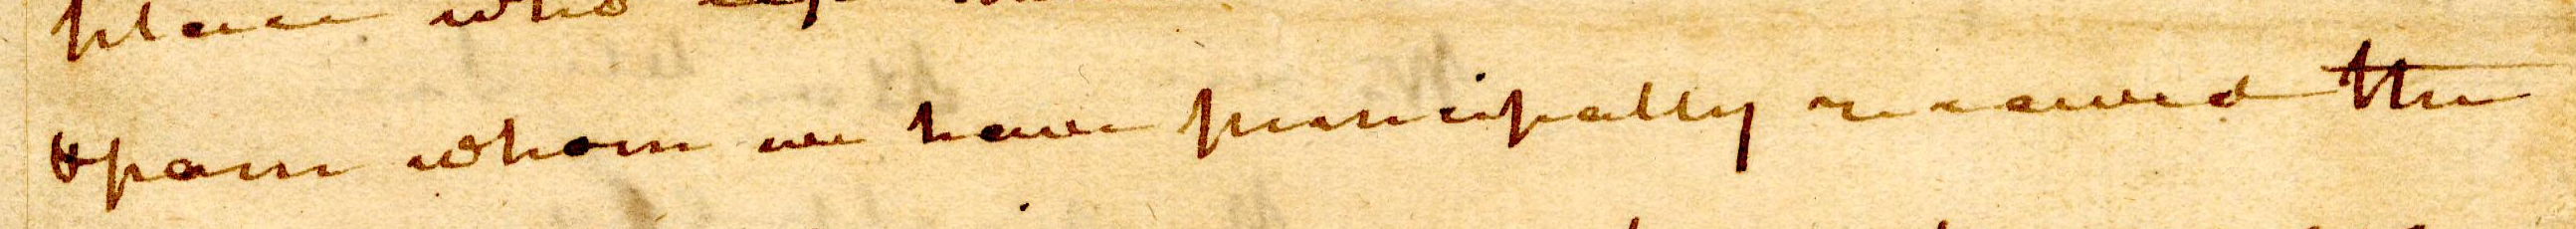& from whom we have peacifally received the
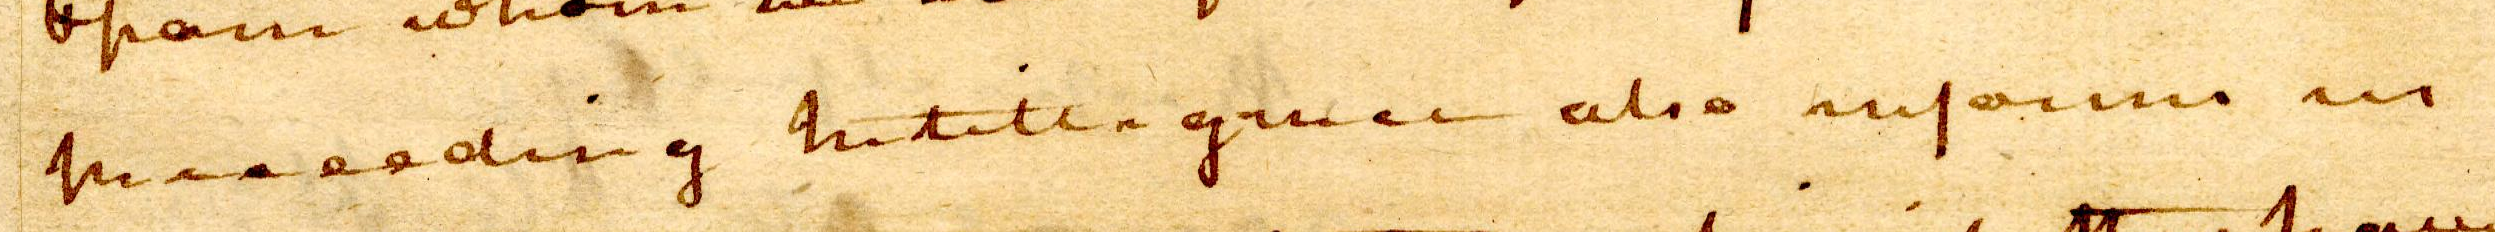proceeding intelligence also informs us
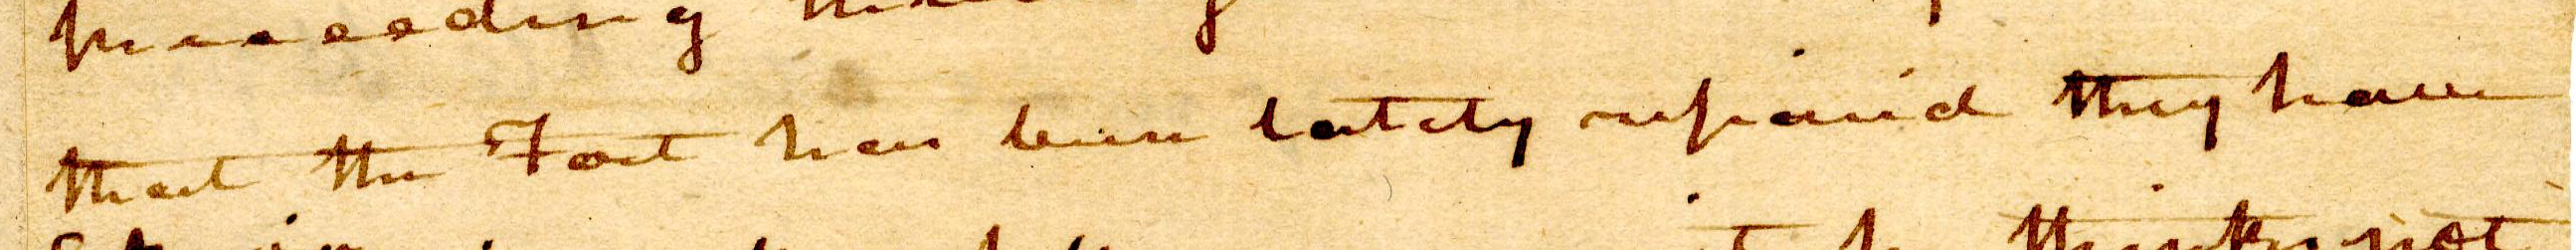that the Fort has been lately reformed they have
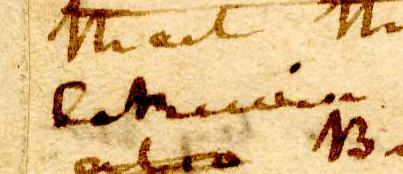likewise
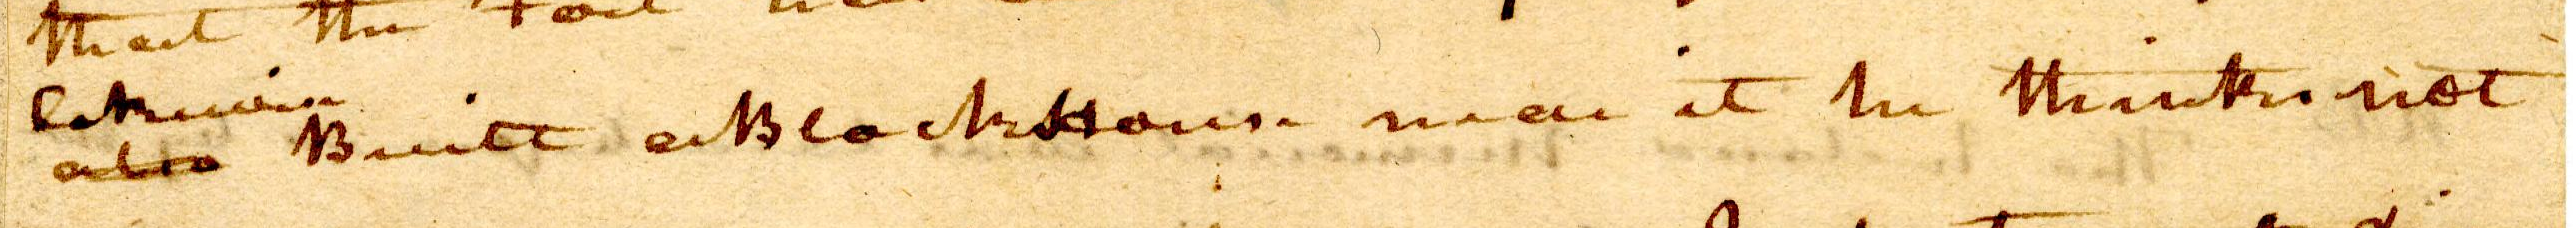also Built a Block House near it he thinks not
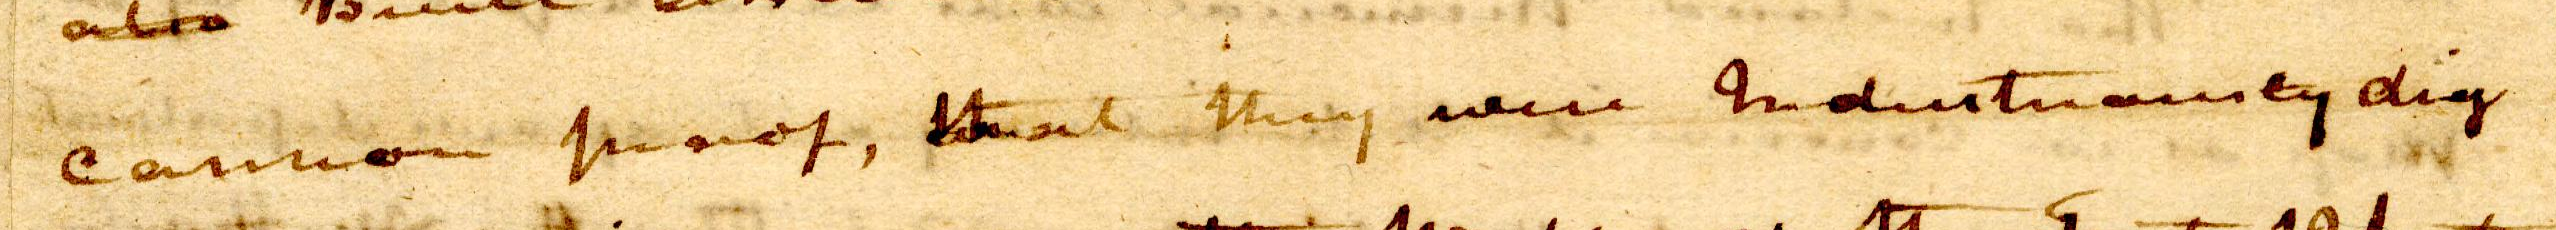cannon proof, that they were Industriously dig
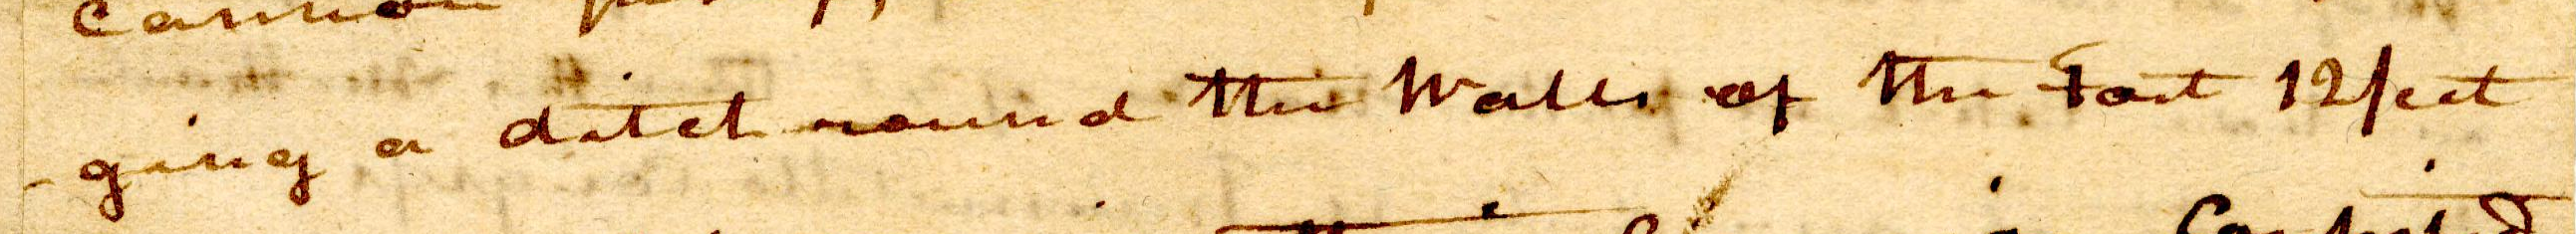-ging a ditch round this Wall of the Fort 12 feat
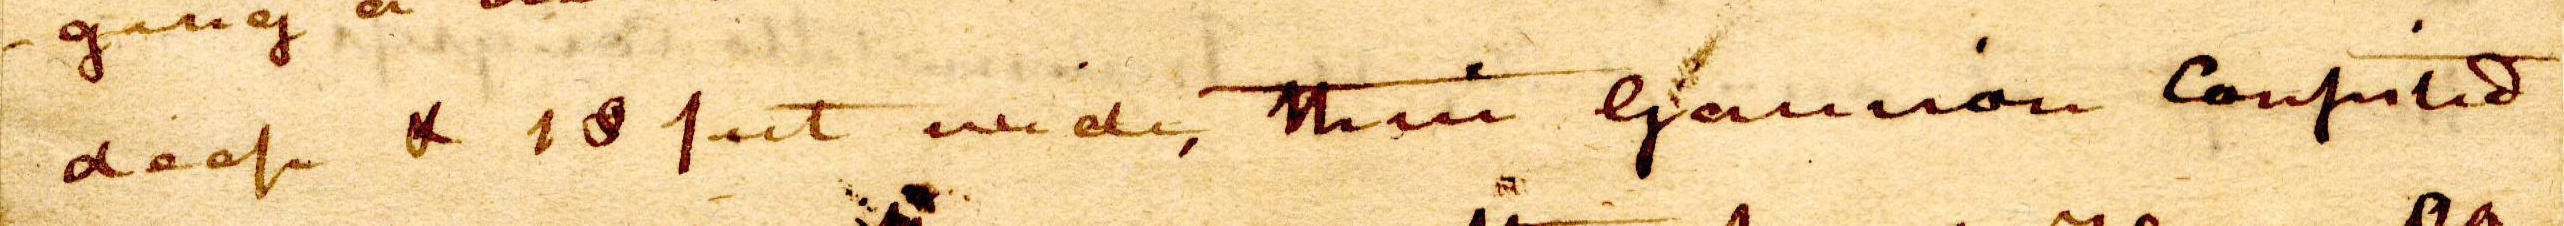deep & 18 feet wide, their Garrison Consisted
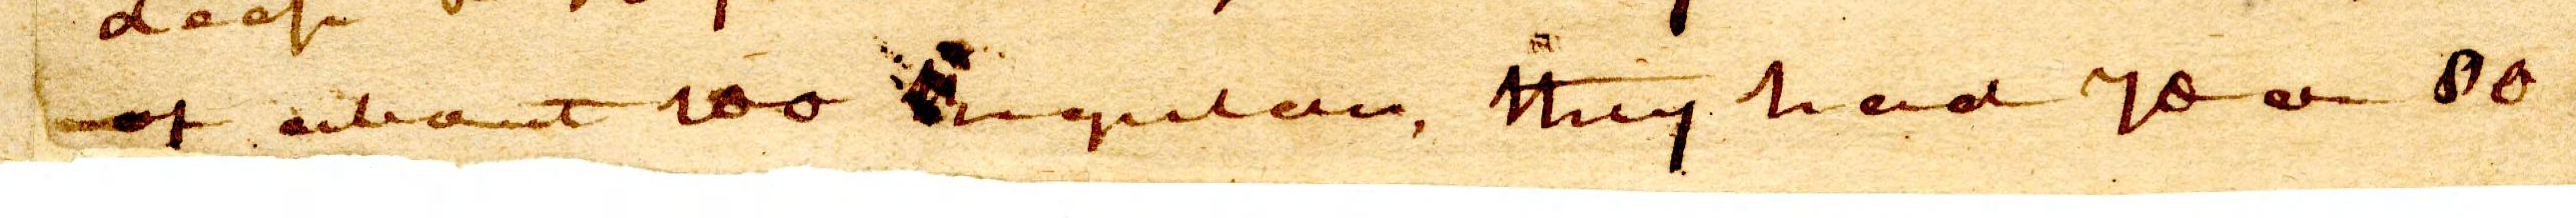of about 100 regulars, they had 70 or 80
